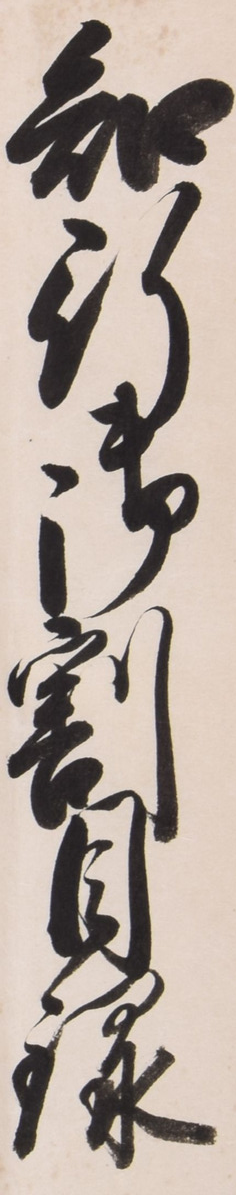知行御割目録
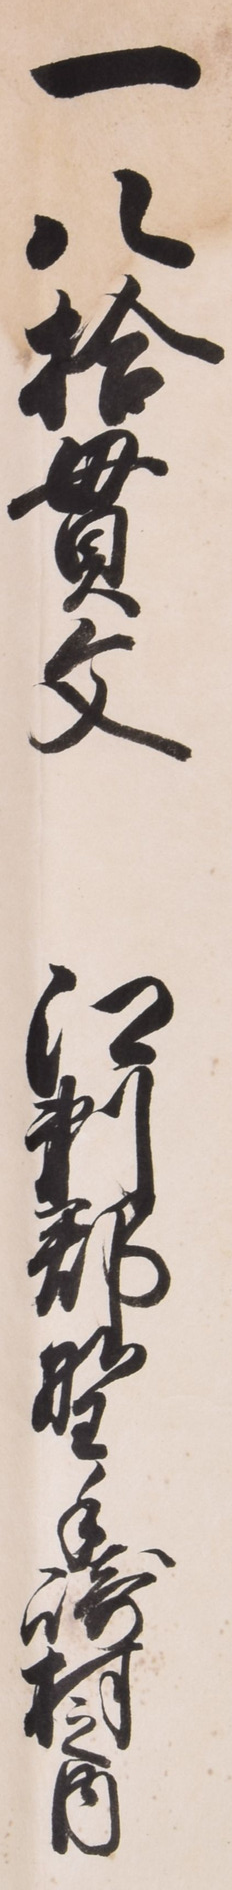一八拾貫文江刺郡野手崎村之内
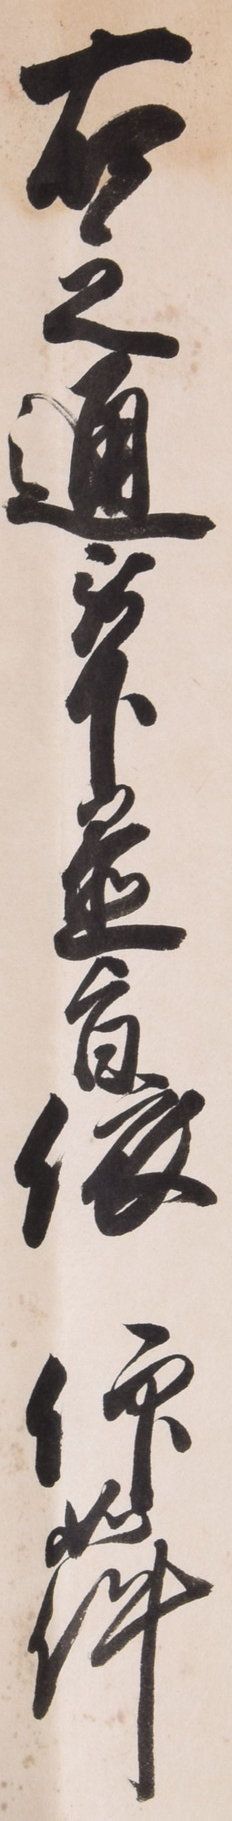右之通被下置旨依仰如件
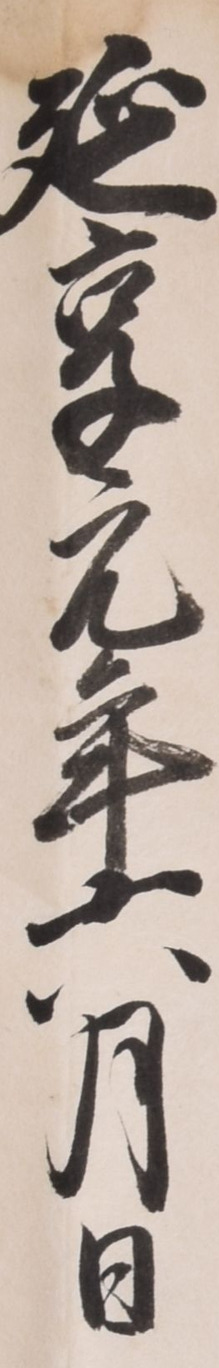延享元年六月日
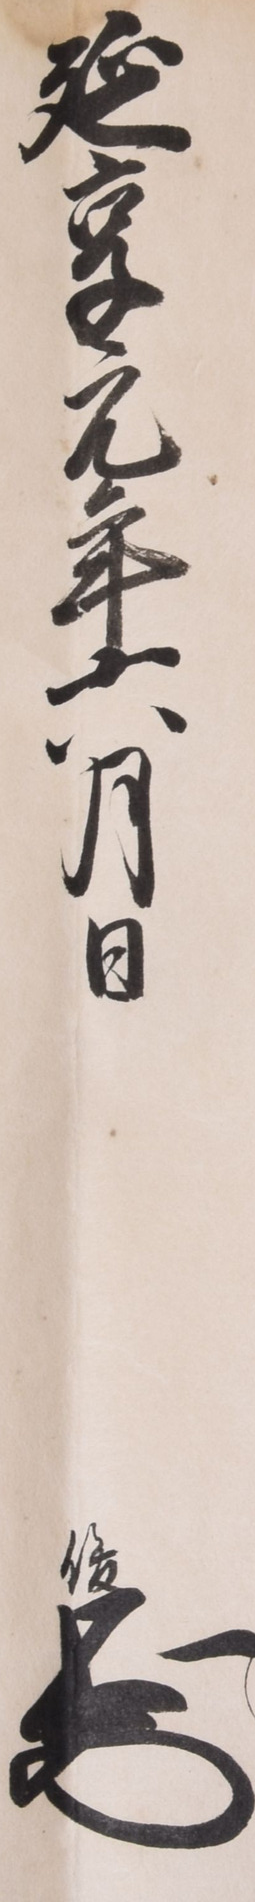延享元年六月日
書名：知行御割目録
